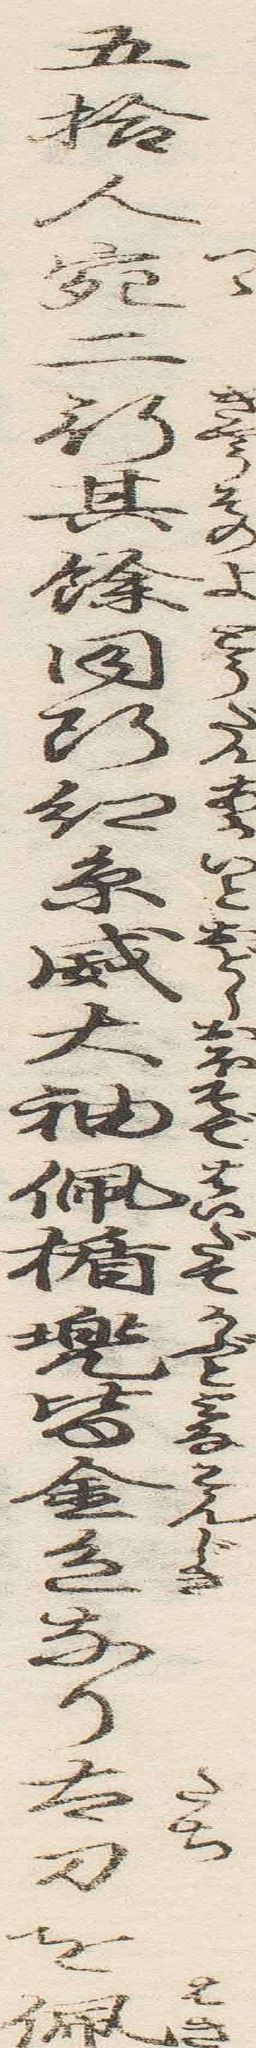五拾人宛二行其餘同断紅糸威大袖佩楯兠皆金色なり太刀を佩
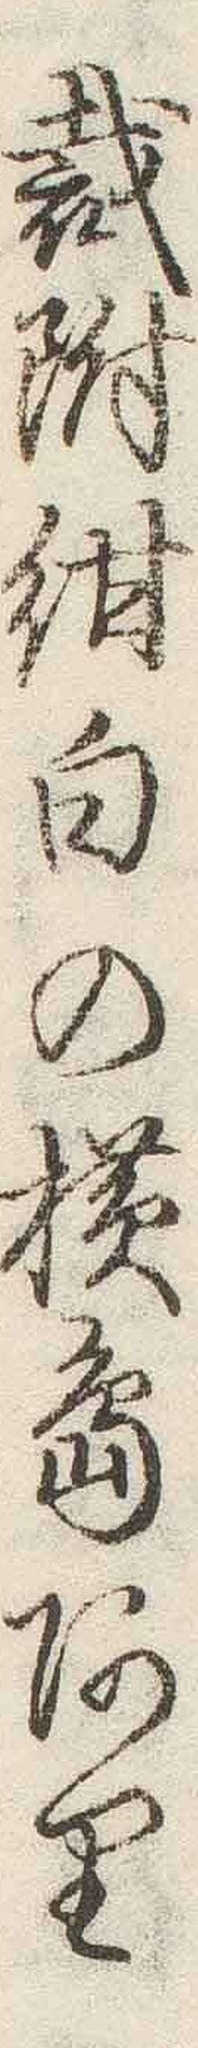裁附紺白の横島あり
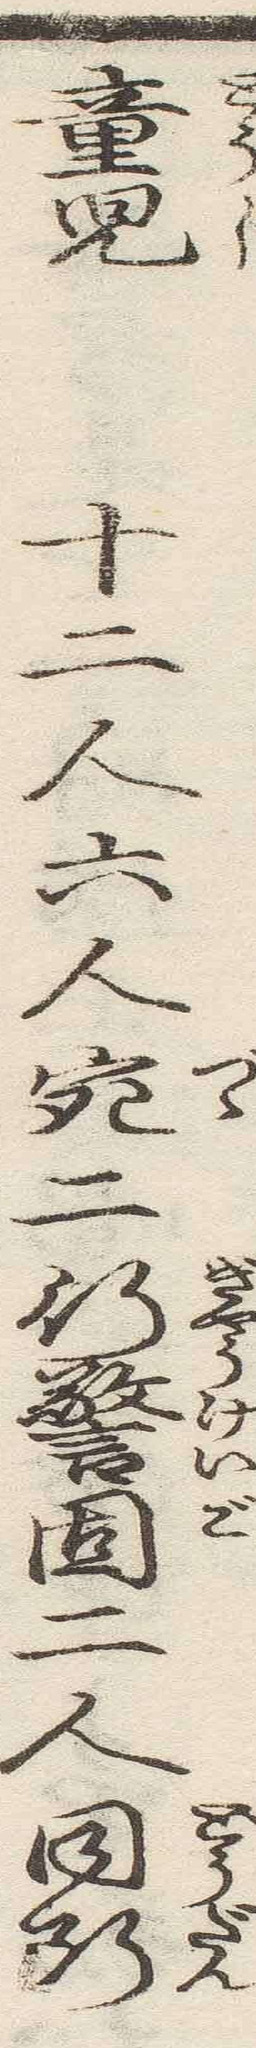童児十二人六人宛二行警固二人同断
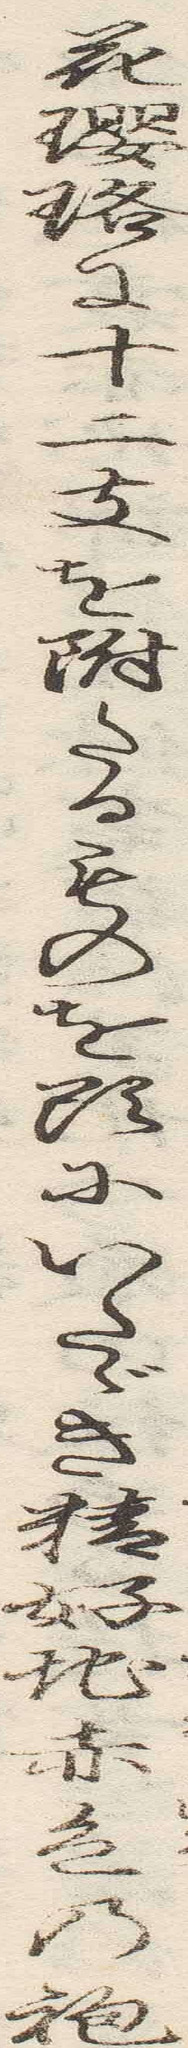花瓔珞に十二支を附たるものを頭にいたゞき精好地赤色の袍
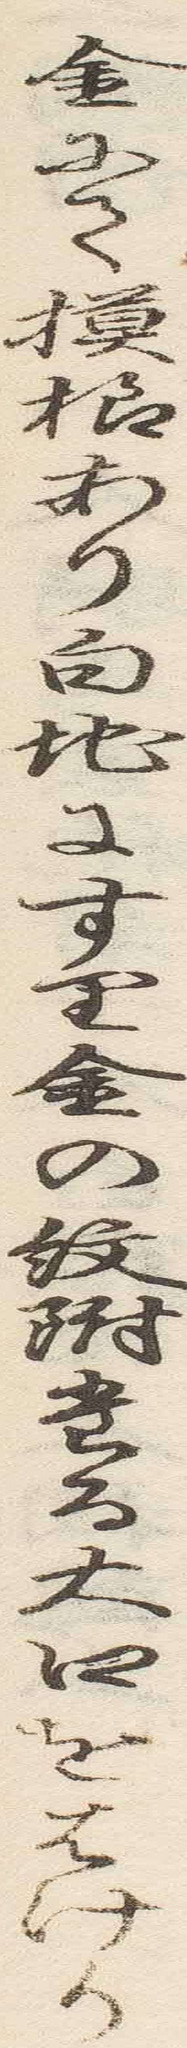金にて摸様あり白地にすり金の紋附たる大口をはけり
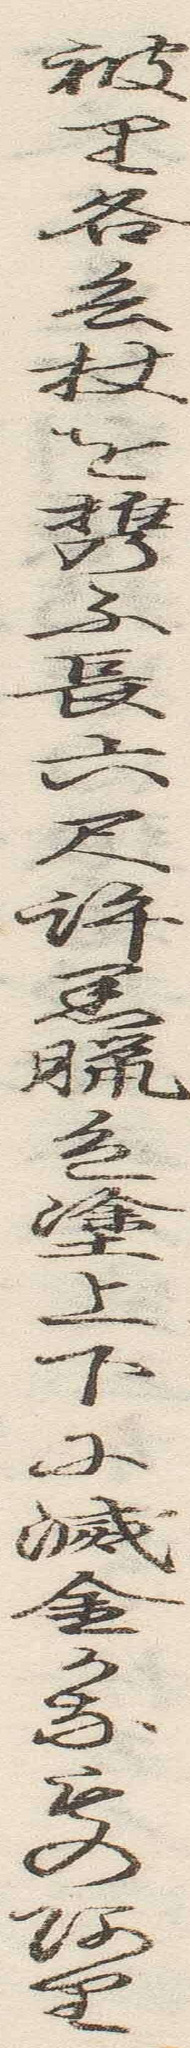被り各兵仗を携ふ長六尺許黒臘色塗上下に滅金かなものあり
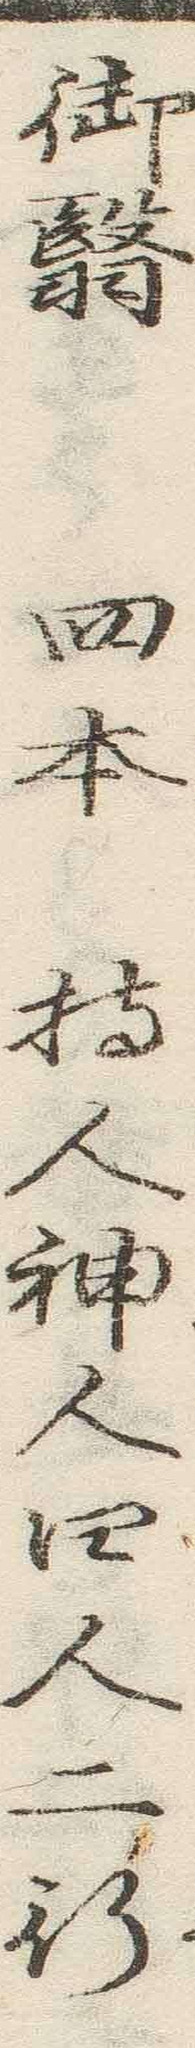御翳四本持人神人四人二行
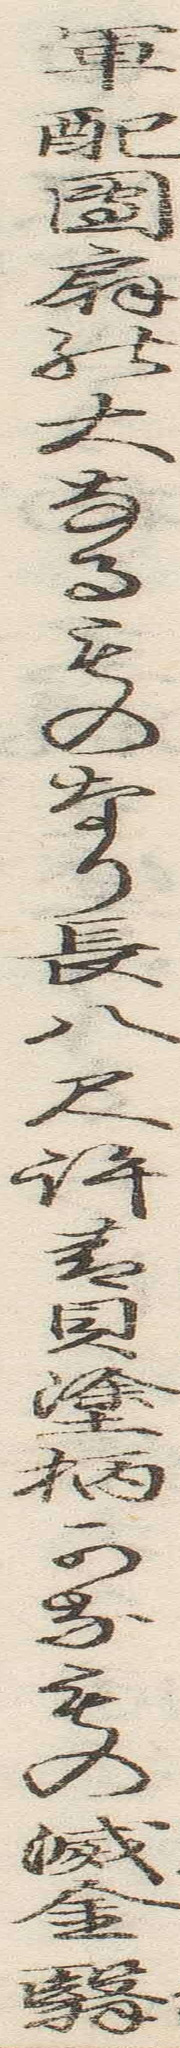軍配團扇の大なるものなり長八尺許青貝塗柄かなもの滅金翳
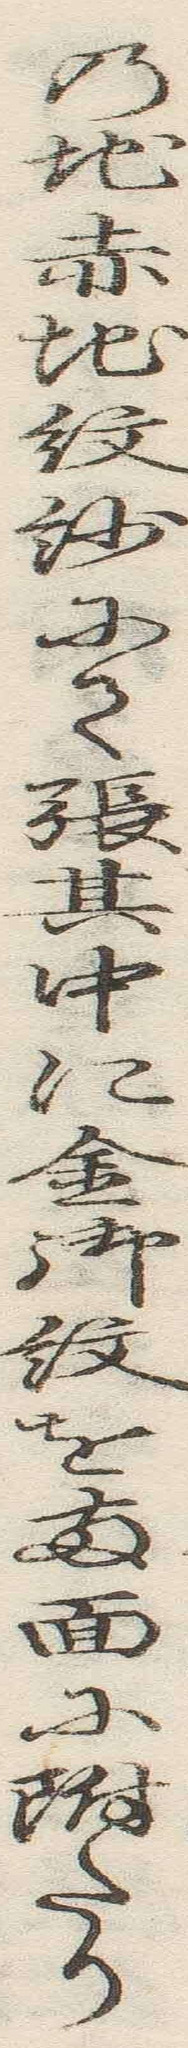の地赤地紋紗にて張其中に金御紋を両面に附たり
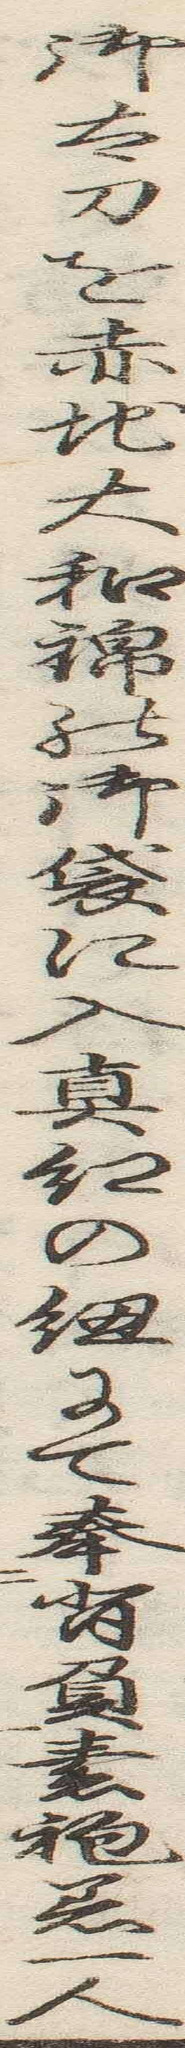御太刀を赤地大和錦の御袋に入真紅の紐にて奉背負素袍着一人
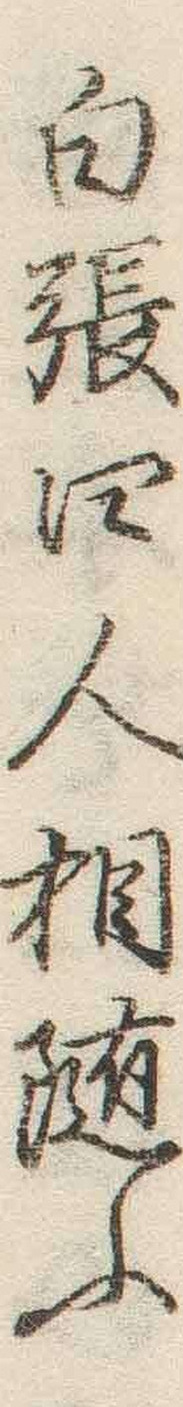白張四人相随ふ
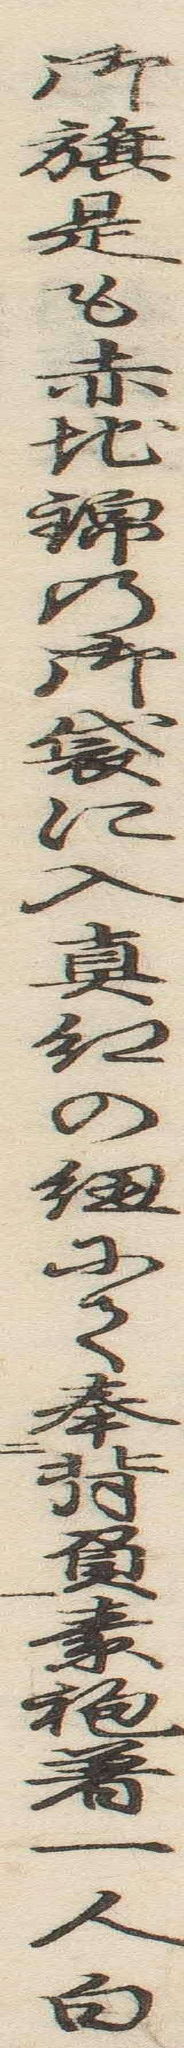御旗是も赤地錦の御袋に入真紅の紐にて奉背負素袍着一人白

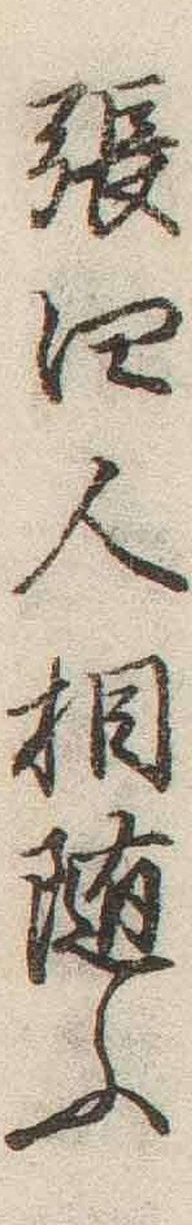張四人相随ふ
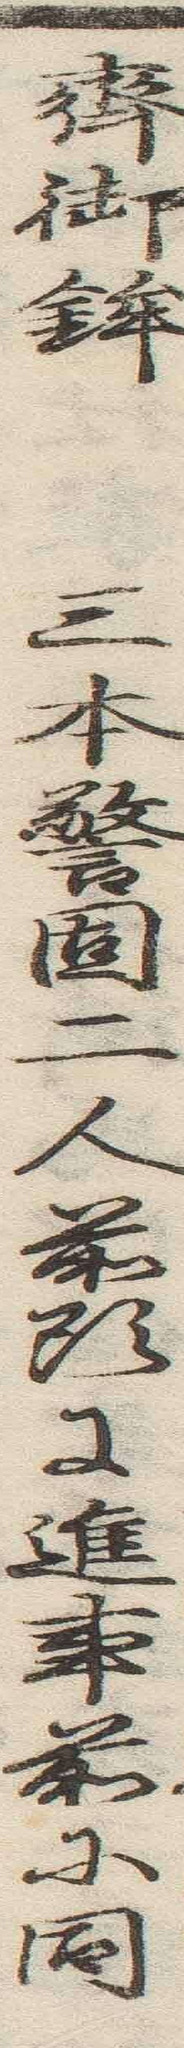齊御鉾三本警固二人前頭に進事前に同じ
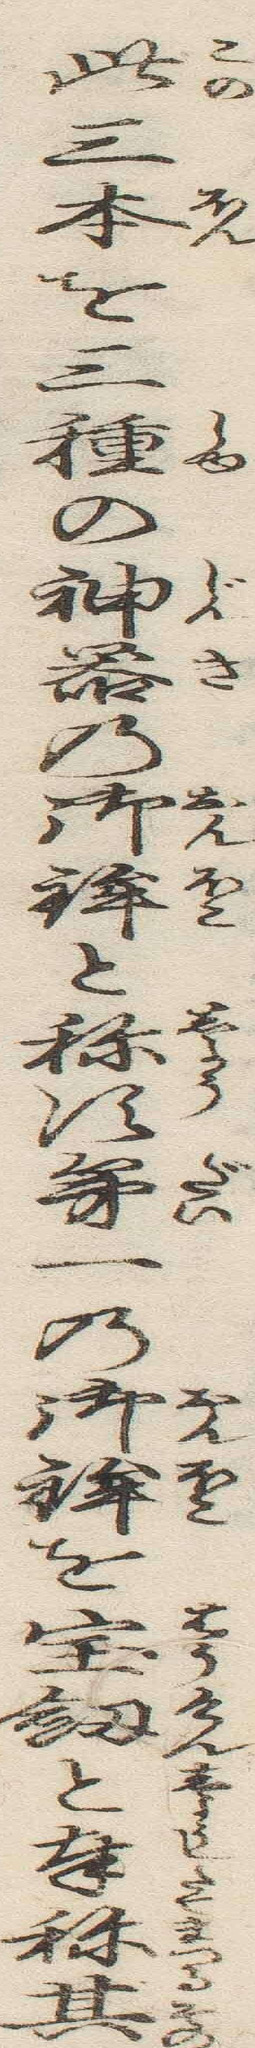此三本を三種の神器の御鉾と称す第一の御鉾を宝剱と奉称其
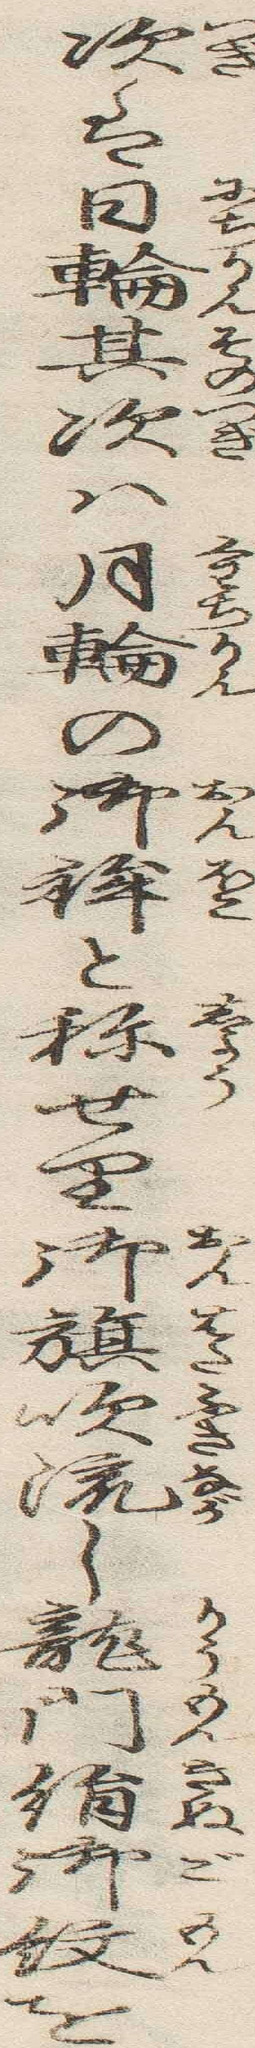次は日輪其次は月輪の御鉾と称せり御旗吹流し龍門絹御紋を
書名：日光山志
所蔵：東京学芸大学附属図書館 国文学研究資料館
